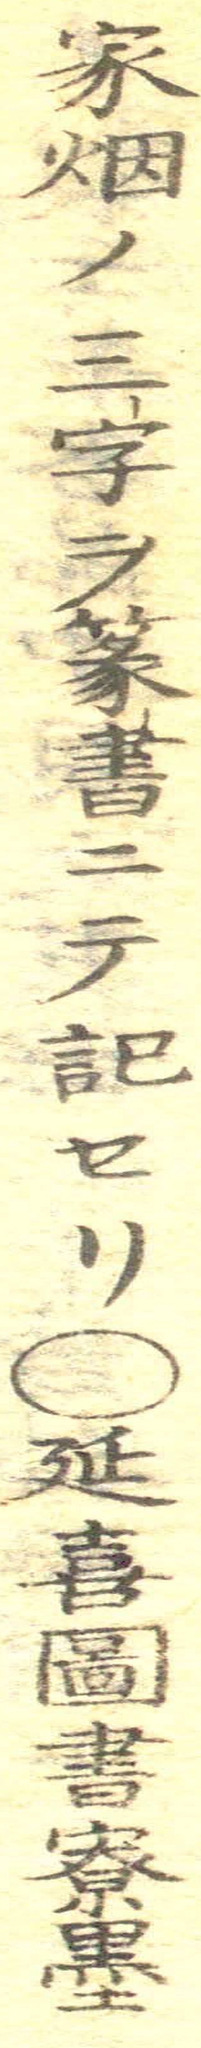家煙ノ三-字ヲ篆書ニテ記セリ○延喜図書寮-墨
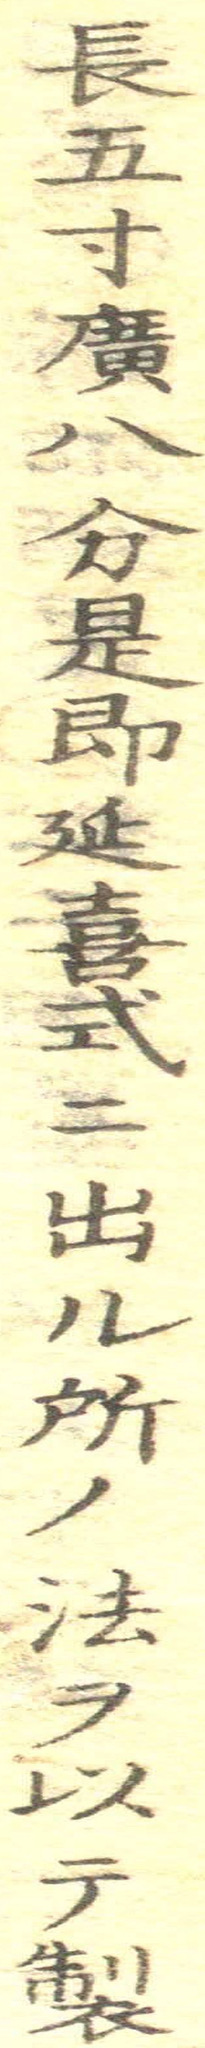長五寸広八分是即延喜式ニ出ル所ノ法ヲ以テ製
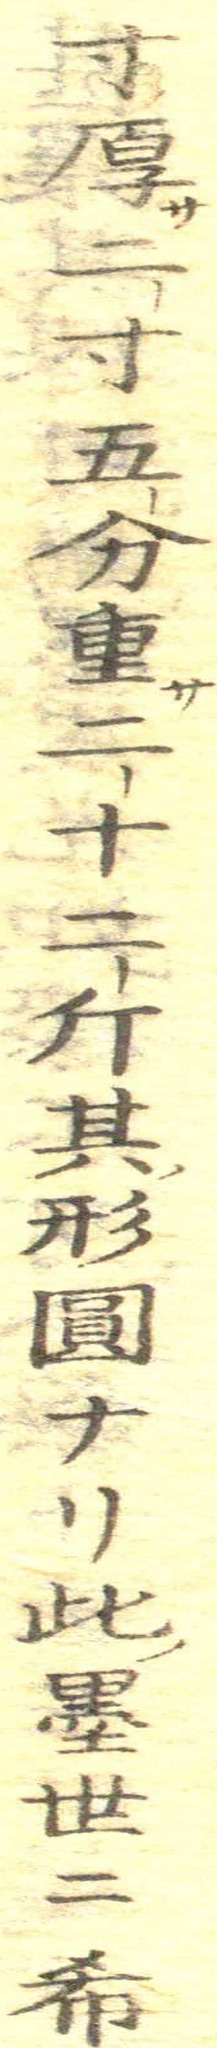寸厚寸五-分重二-十二-斤其形円ナリ此墨世ニ希
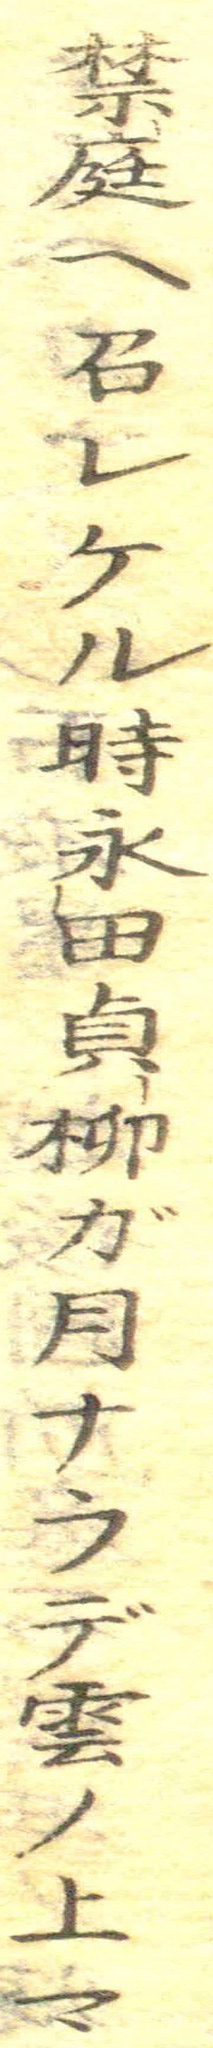禁庭ヘ召レケル時永田貞-柳ガ月ナラデ雲ノ上マ
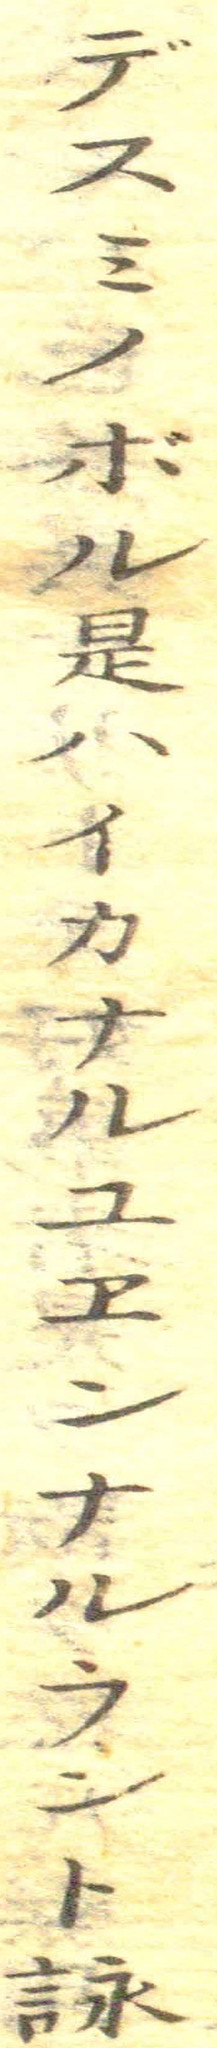デスミノポル是ハイカナルユヱンナルラント詠

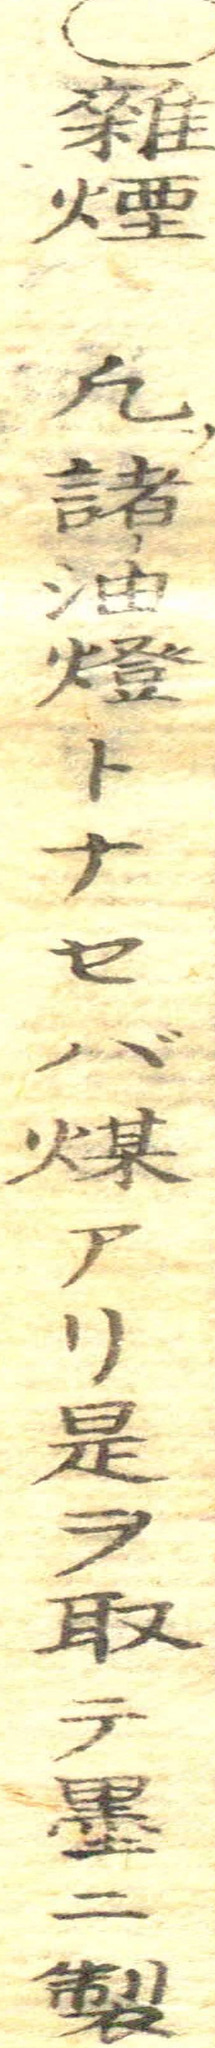○雑煙凡諸-油燈トナセバ煤アリ是ヲ取テ墨ニ製
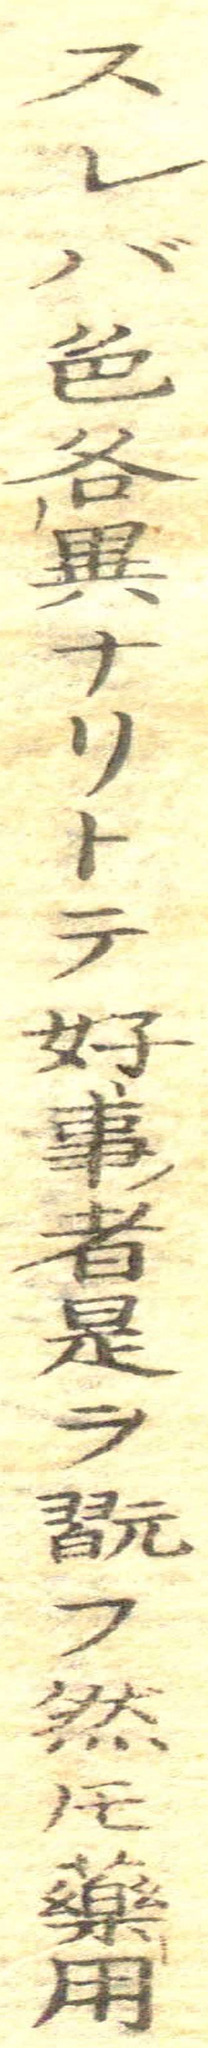スレバ色各-異ナリトテ好-事者是ヲ翫フ然トモ薬用
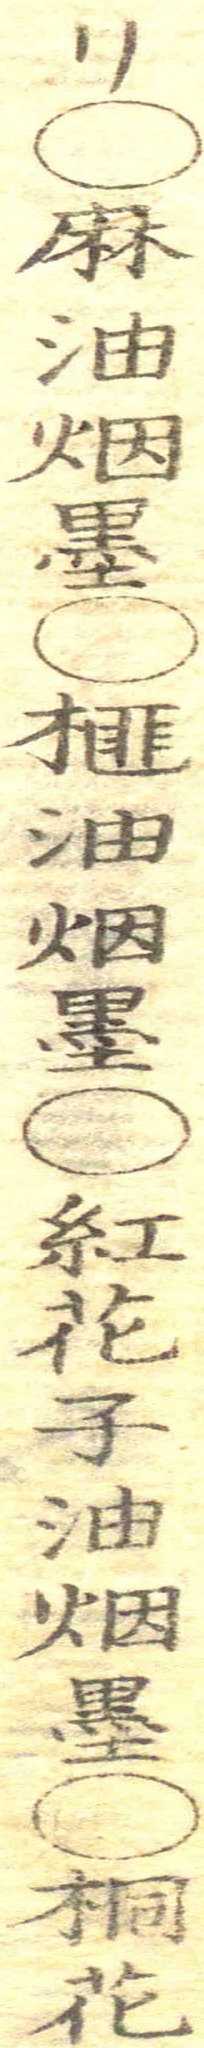リ○麻油煙墨○榧油煙墨○紅花子油煙墨○桐花
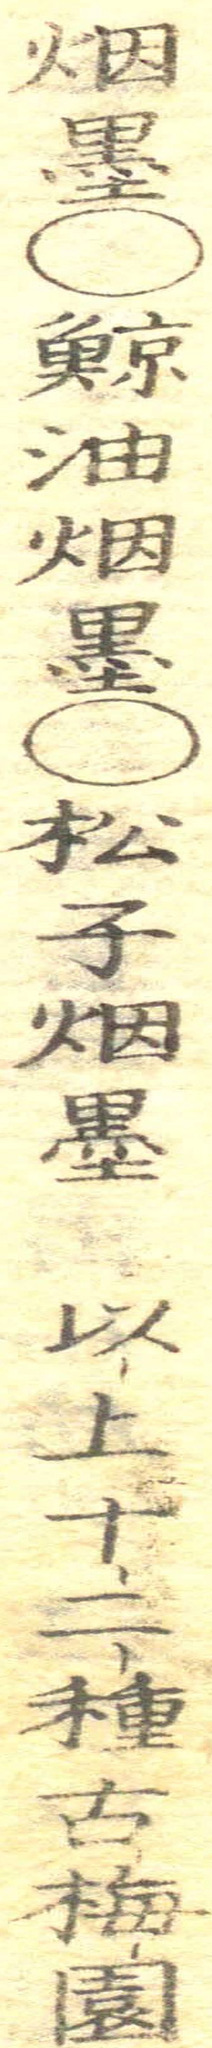煙墨○鯨油煙墨○松子煙墨以上十-二-種古-梅-園
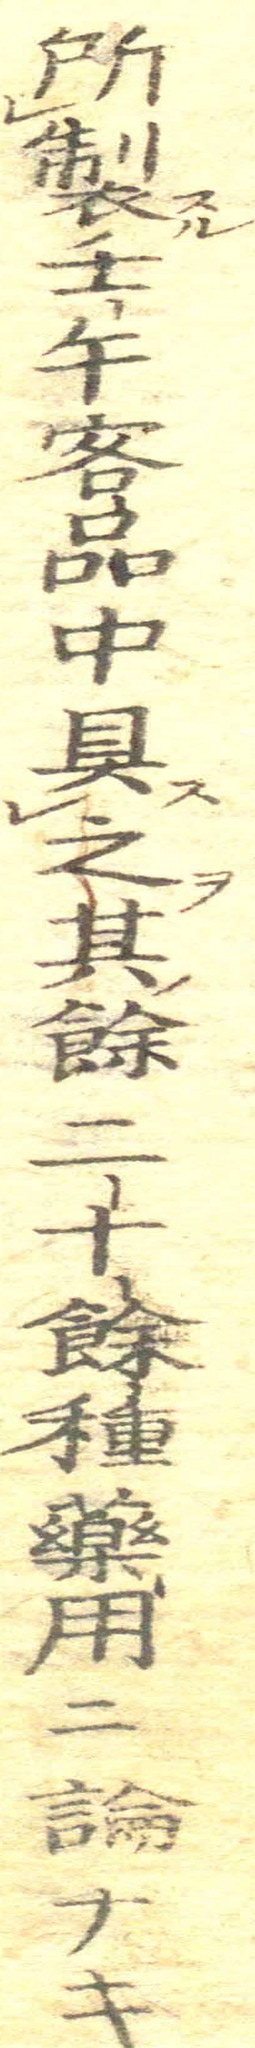所製壬-午客-品中具之其余二-十-余-種薬-用ニ論ナキ
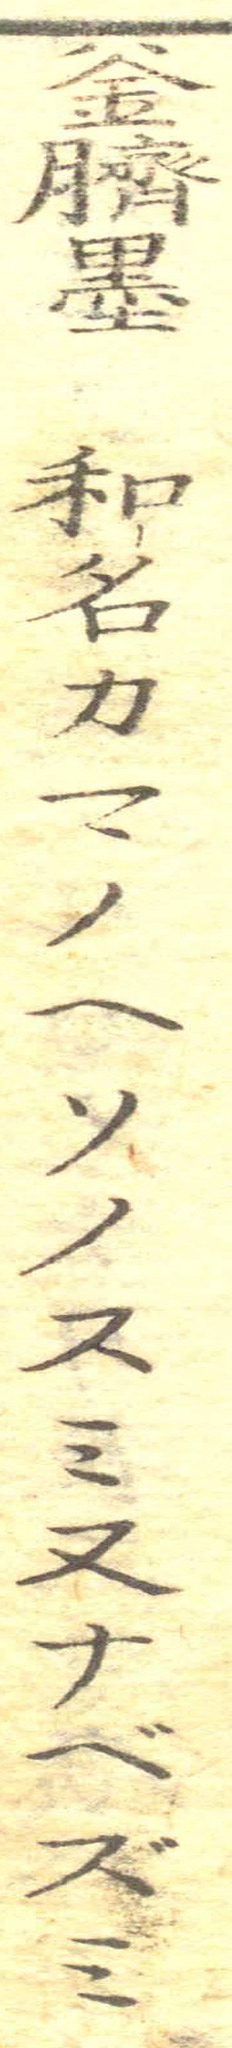釜臍墨和-名カマノヘソノスミ又ナペズミ
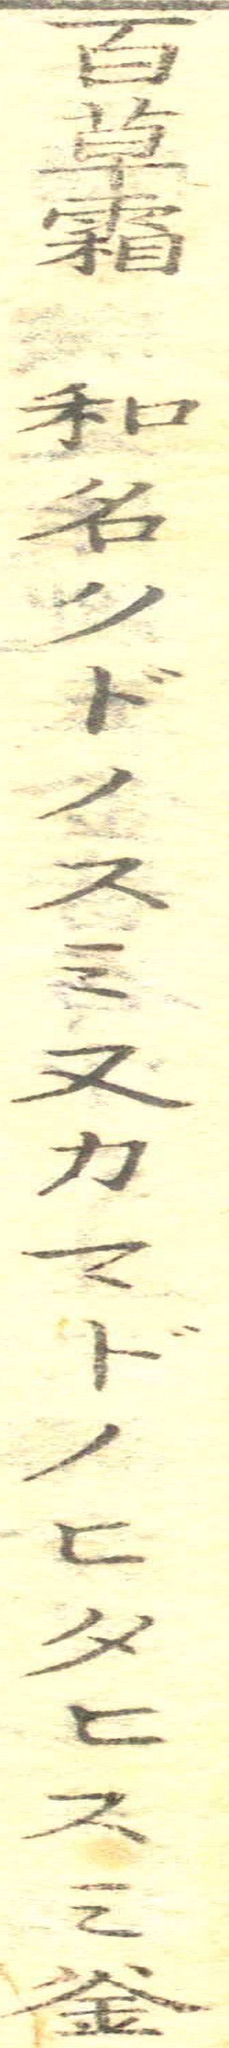百草霜和名クドノスミ又カマドノヒタヒスミ釜
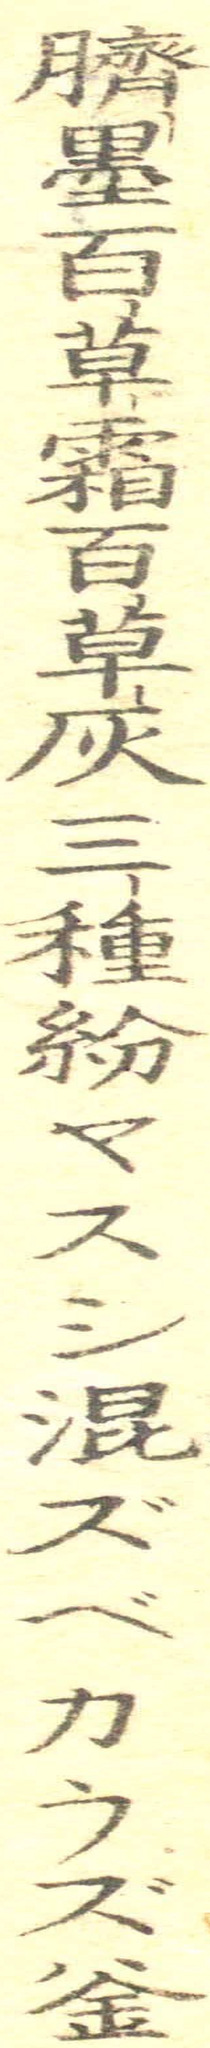臍-墨百-草-霜百-草-灰三-種紛ヤスシ混ズベカラズ釜
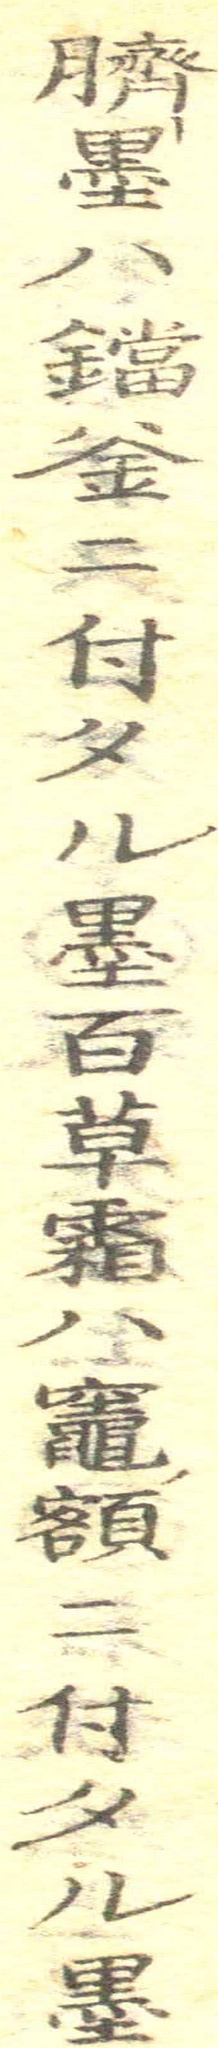臍-墨ハ鐺釜ニ付タル墨百草霜ハ竈額ニ付タル墨
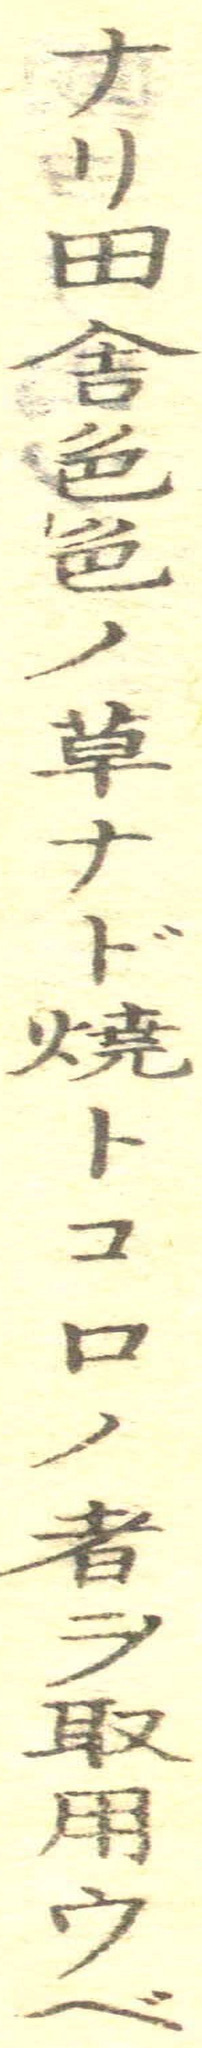ナリ田舎色-色ノ草ナド焼トコロノ者ヲ取用ウベ
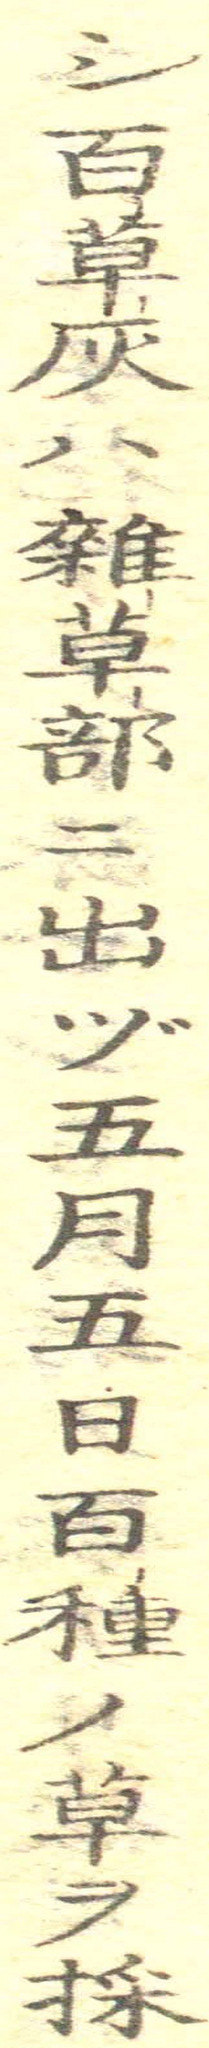シ百-草-灰ハ雑-草-部ニ出ヅ五月五日百種ノ草ヲ採
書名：物類品隲
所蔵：国文学研究資料館
